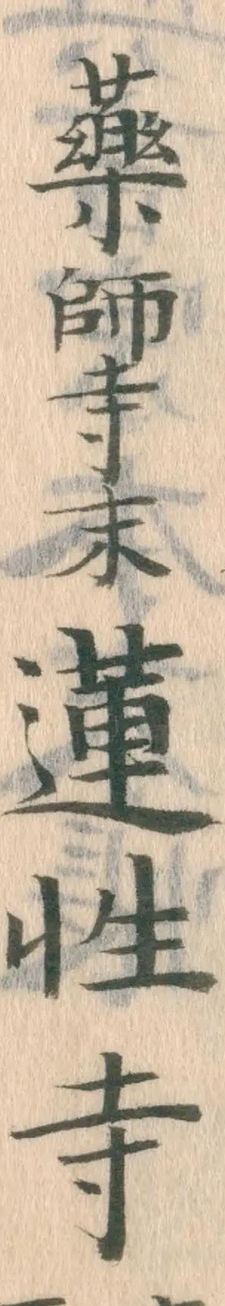薬師寺末安楽寺
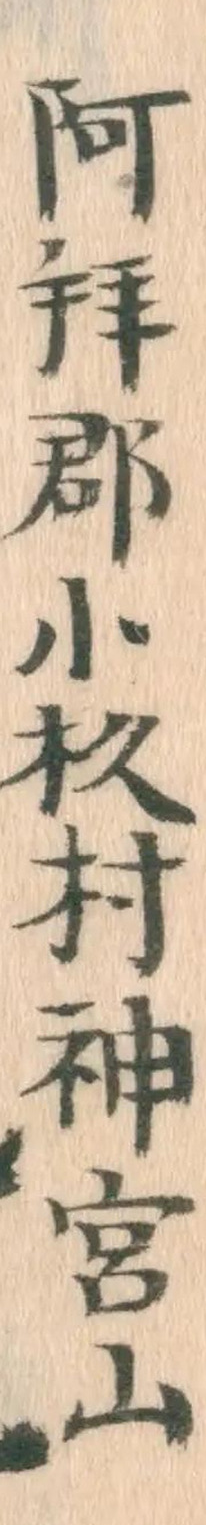阿拝郡小杉村神宮山
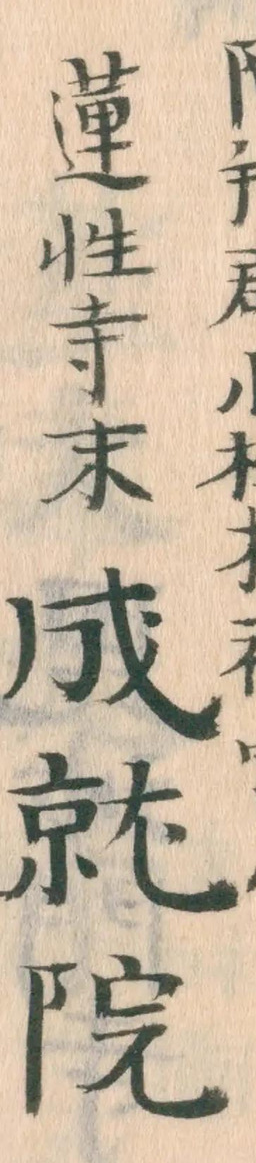蓮性院松成就院
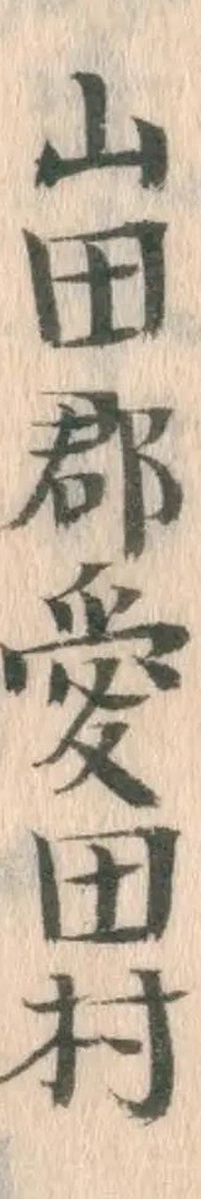山田文愛田村
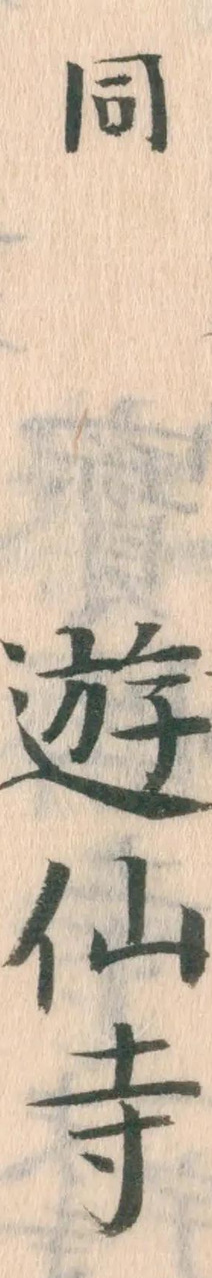同遊仙寺
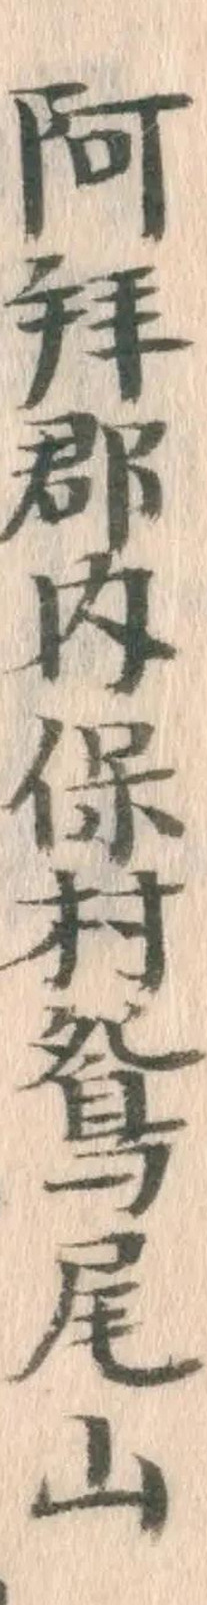阿拝郡内保村鷲尾山
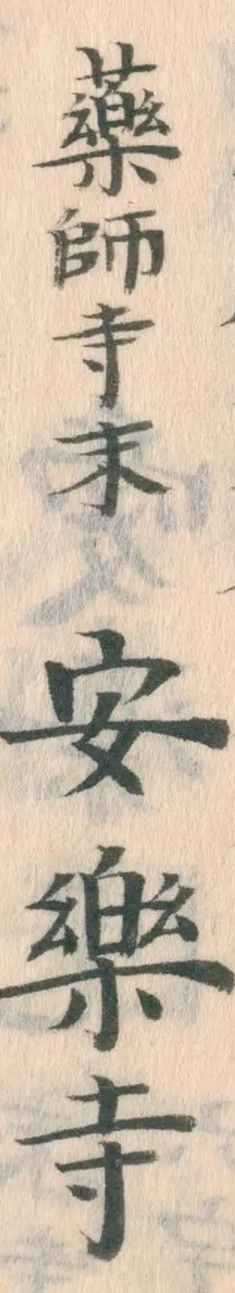薬師寺末安楽寺
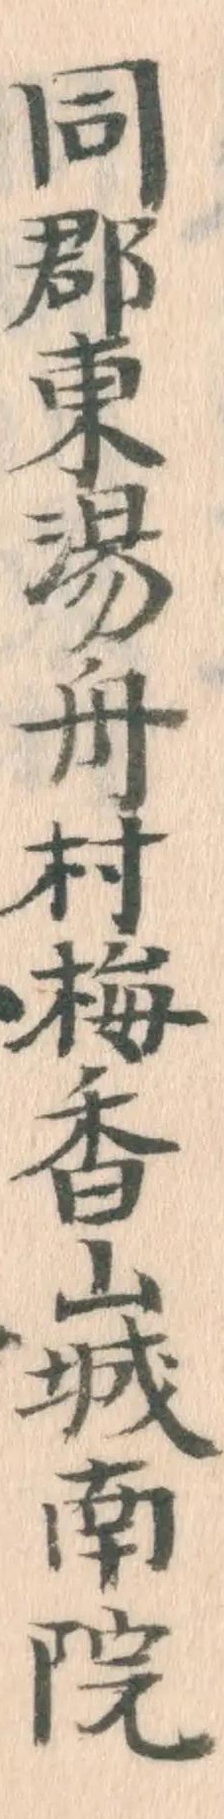同郡東湯舟村梅香山城南院
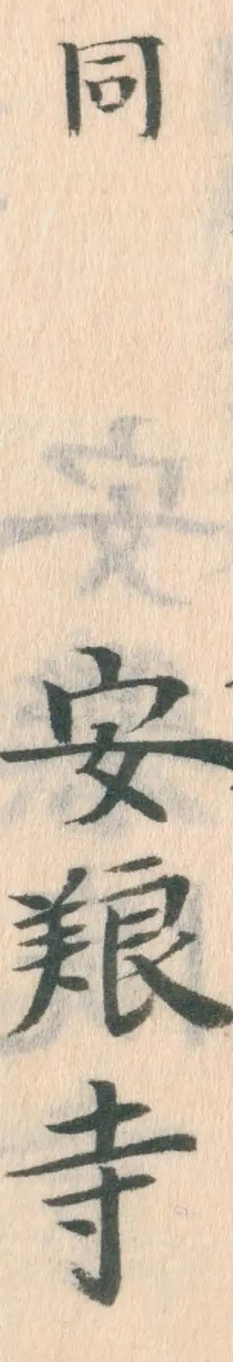同安羪寺

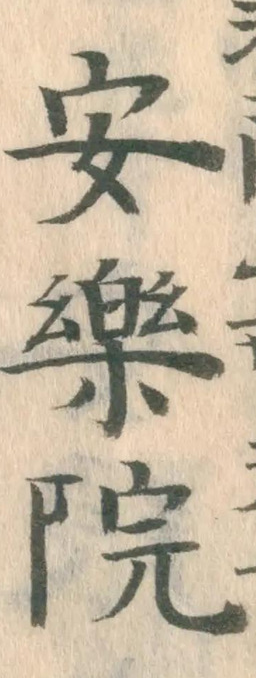安楽院
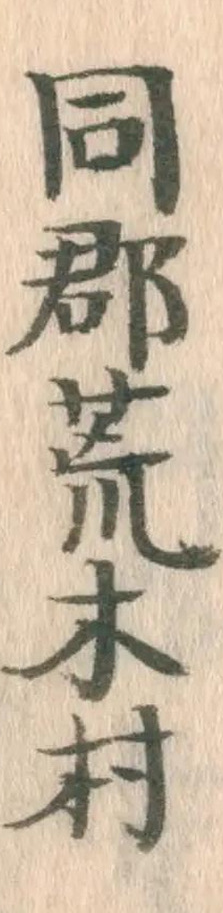同郡荒木村
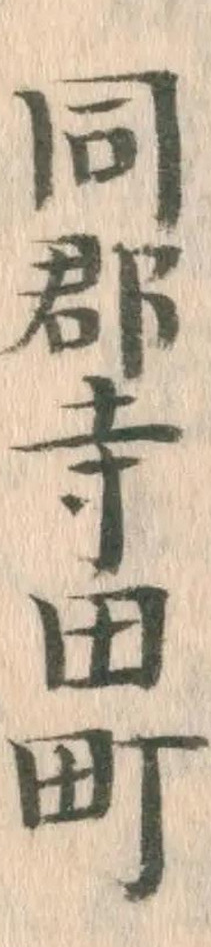同郡寺田町
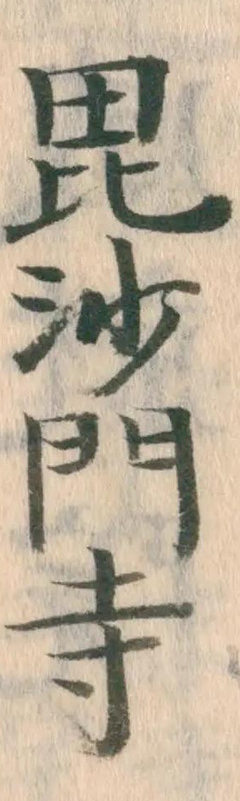毘沙門寺
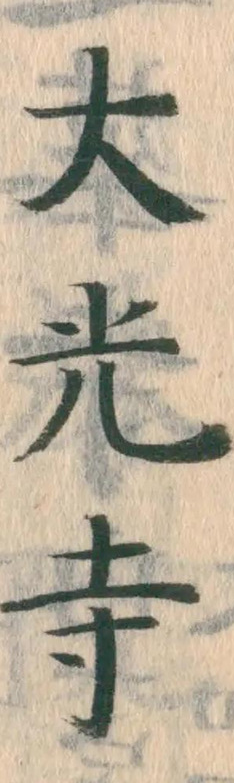大光寺
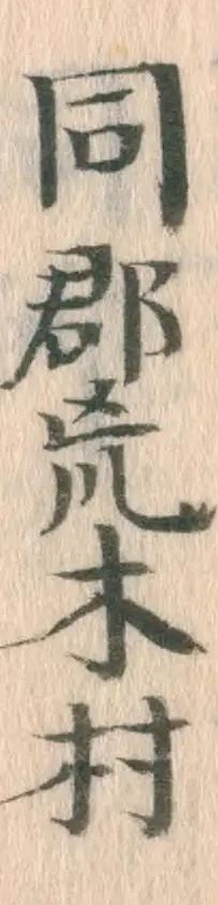同郡荒木村
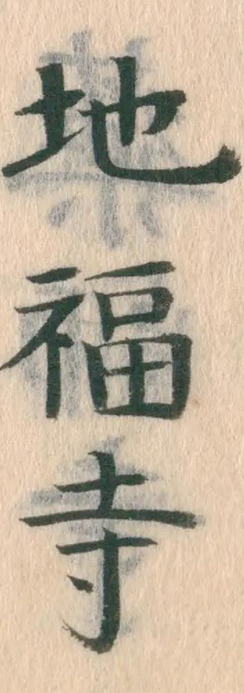地福寺
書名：古義真言宗本末帳 21巻. [4] 第三 伊賀国、伊勢国、志摩国、尾張国、三河国、遠江国、駿河国、伊豆国、甲斐国
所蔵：国立国会図書館 National Diet Library, JAPAN
